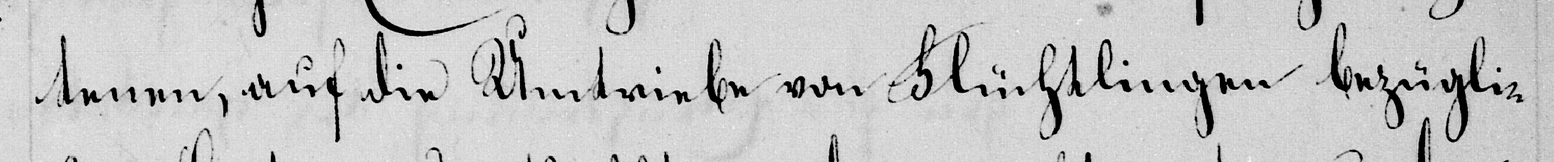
tenen, auf die Umtriebe von Flüchtlingen bezügli¬
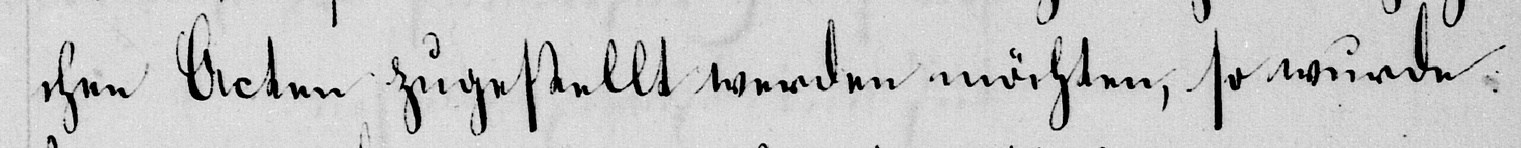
chen Acten zugestellt werden möchten, so wurde
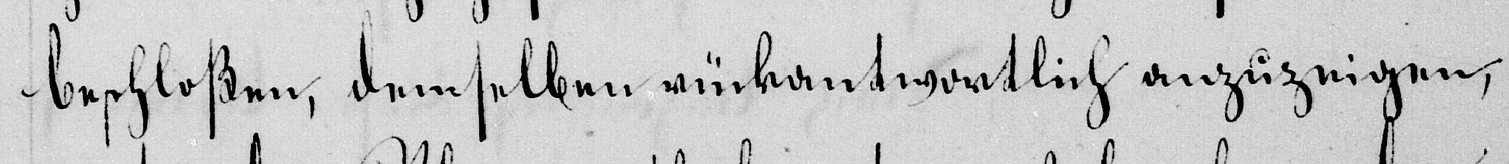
beschloßen, demselben rückantwortlich anzuzeigen,
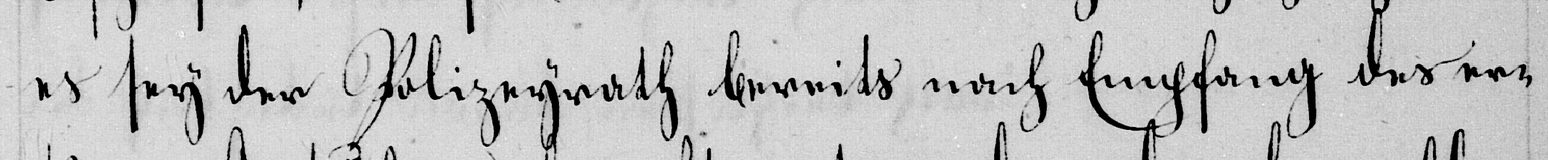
es sey der Polizeyrath bereits nach Empfang des er¬
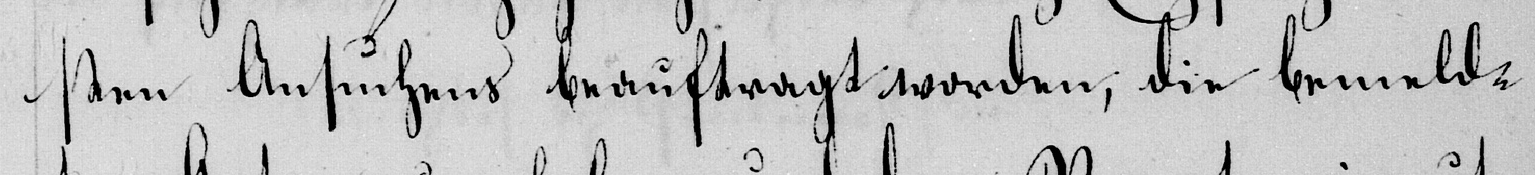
sten Ansuchens beauftragt worden, die bemelde¬
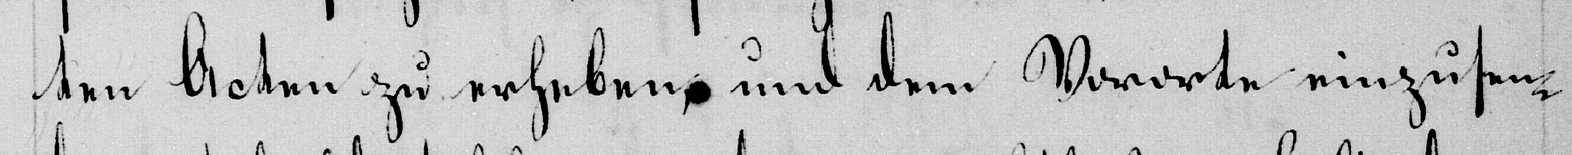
ten Acten zu erheben, und dem Vororte einzusen¬
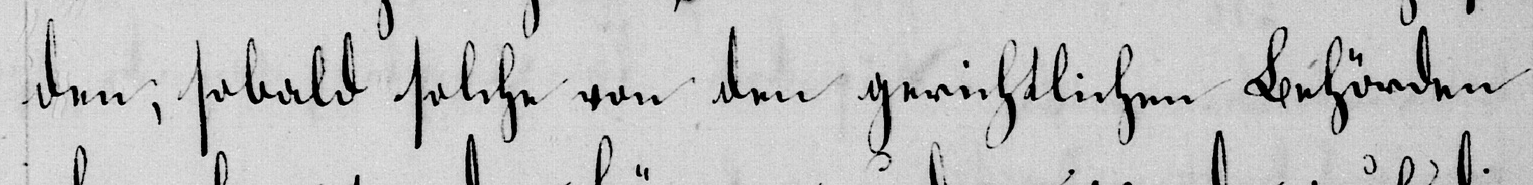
den, sobald solche von den gerichtlichen Behörden
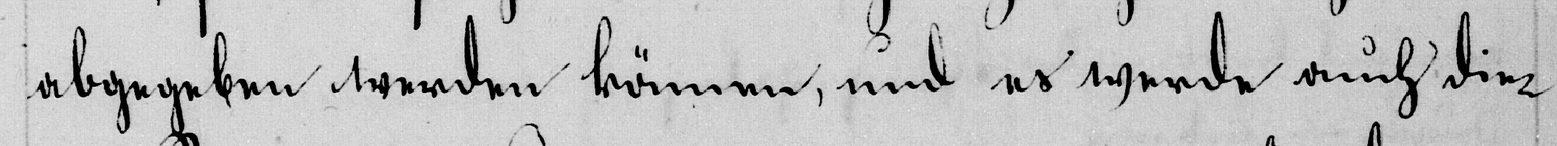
abgegeben werden können, und es werde auch die¬
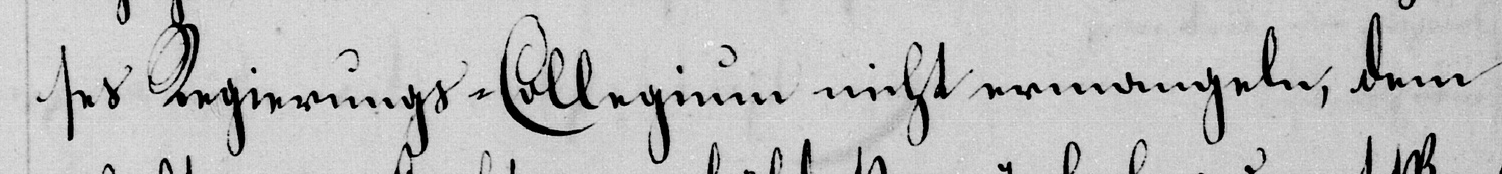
ses Regierungs-Collegium nicht ermangeln, dem
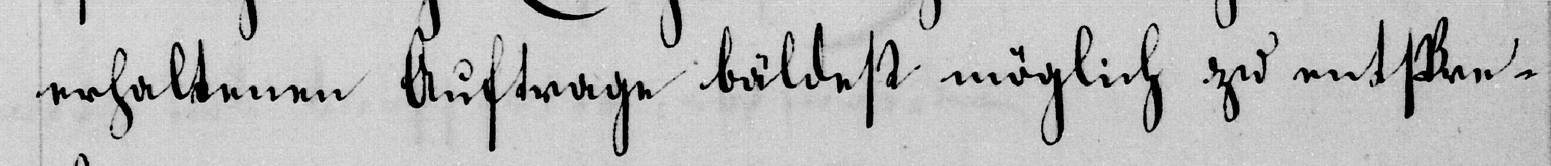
erhaltenen Auftrage bäldest möglich zu entspre¬
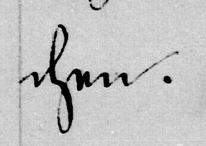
chen.
